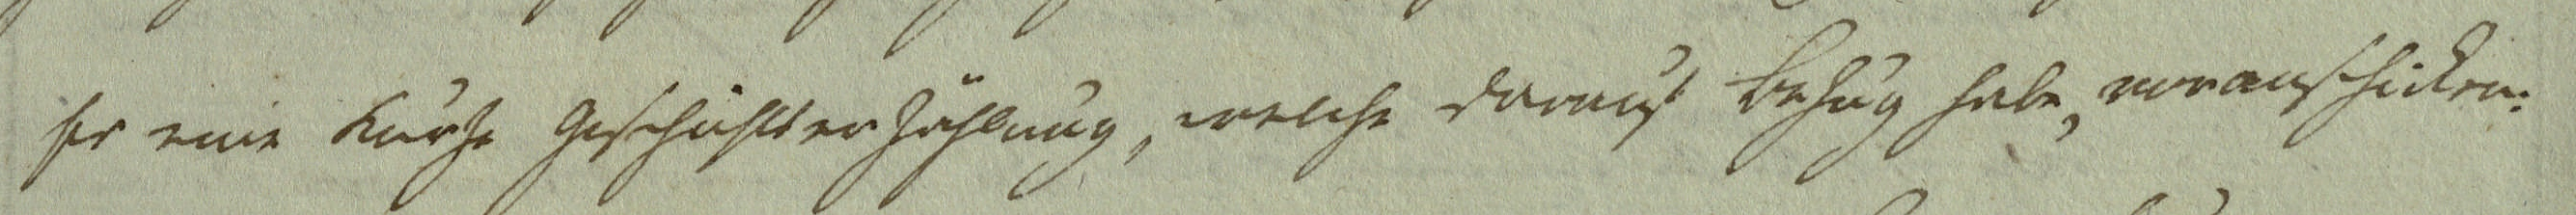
Er eine kurze Geschichtserzählung, welche darauf Bezug habe, voranschicken:
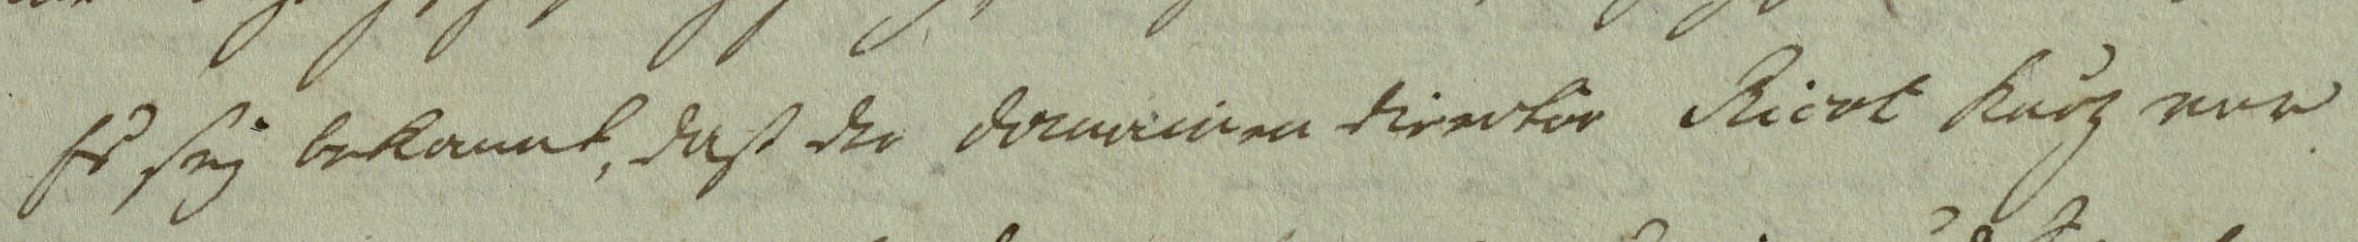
Es seÿ bekannt, daß der Domainen director Ricot kurz vor
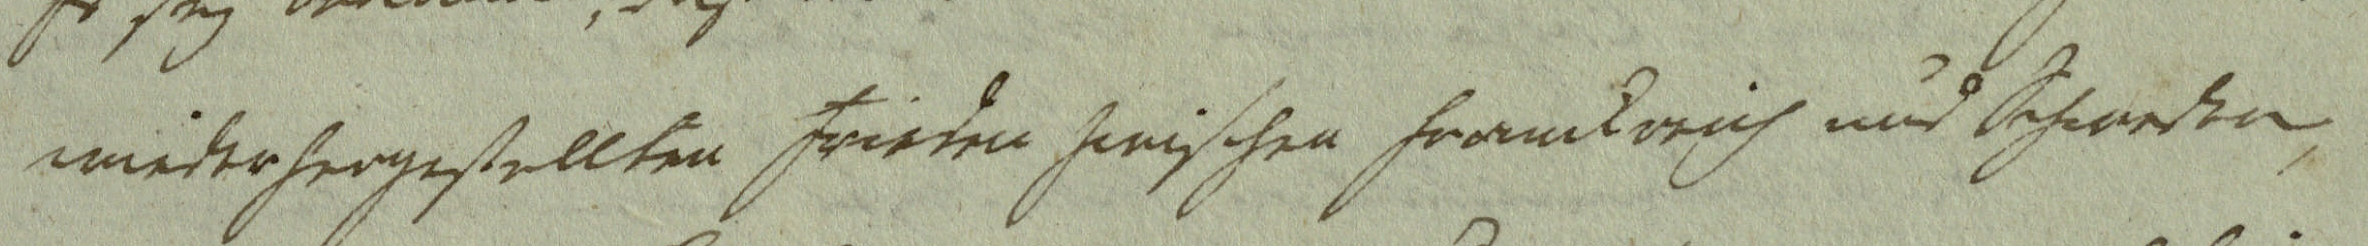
wiederhergestellten Frieden zwischen Franckreich und Schweden
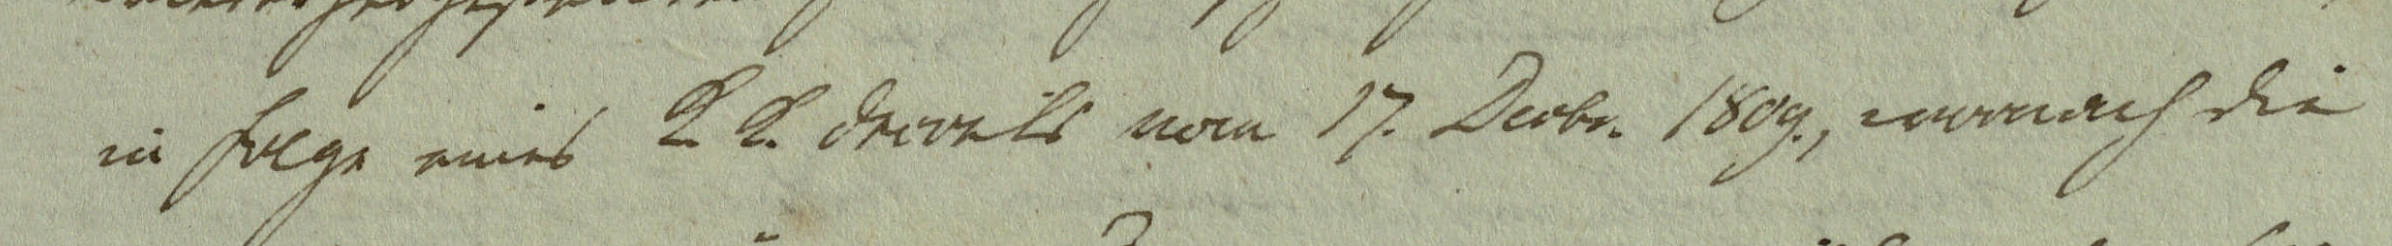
in Folge eines Königl. Decrets vom 17. Decbr. 1809., wornach die
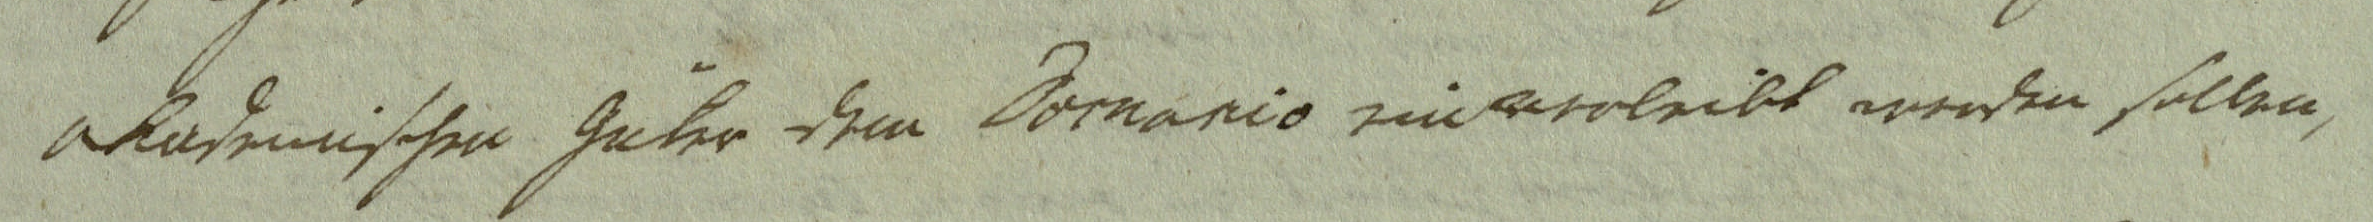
akademischen Güter dem Domanio einverleibt werden sollen,
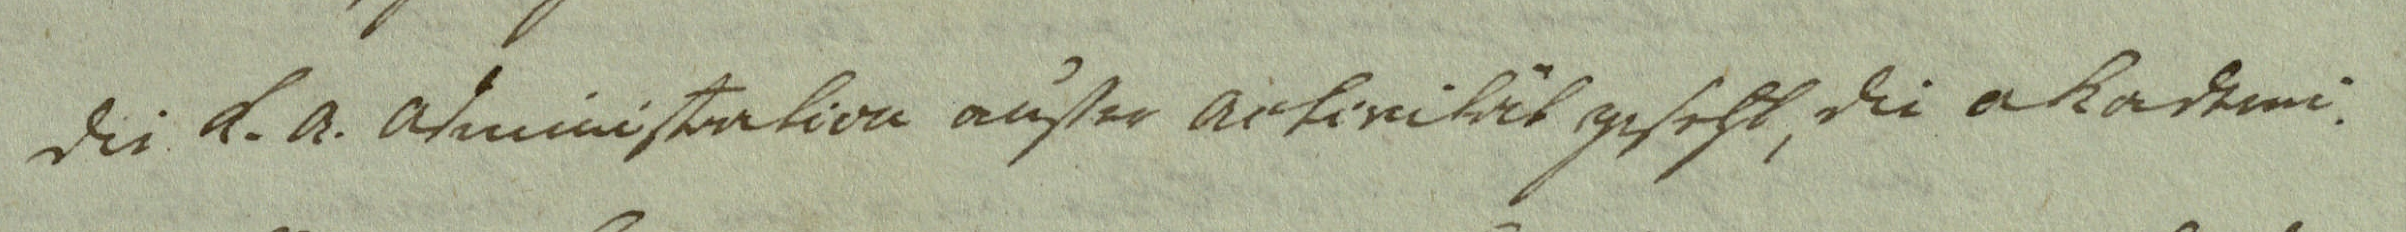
die K. A. Administration außer Activität gesetzt, die akademi¬
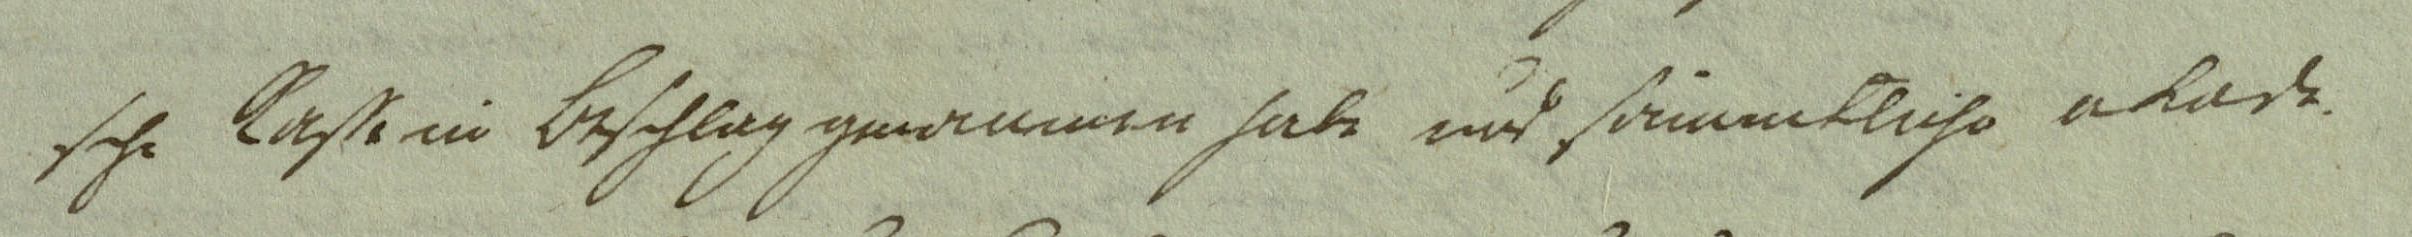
sche Kasse in Beschlag genommen habe und sämmtliche akade¬
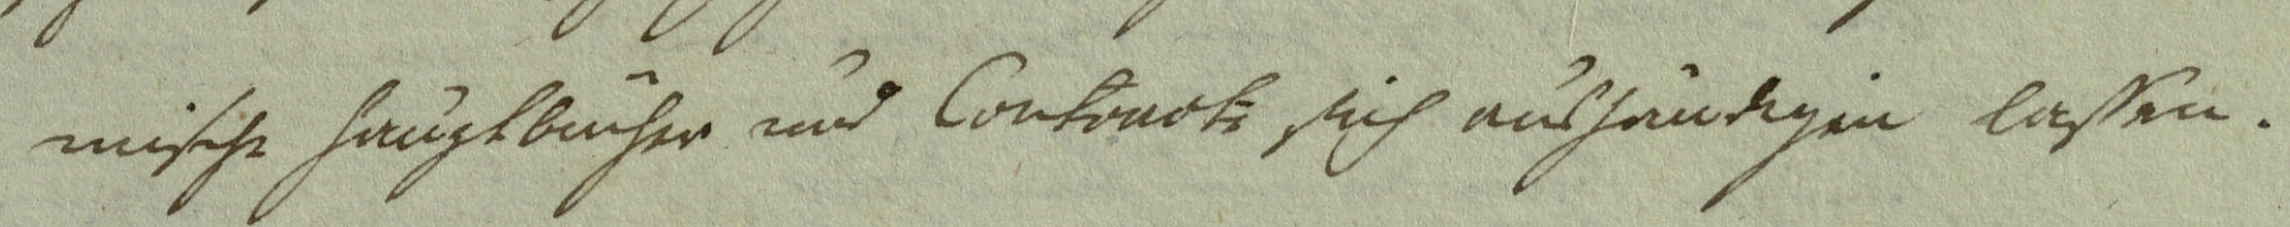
mische Hauptbücher und Contracte sich aushändigen lassen.
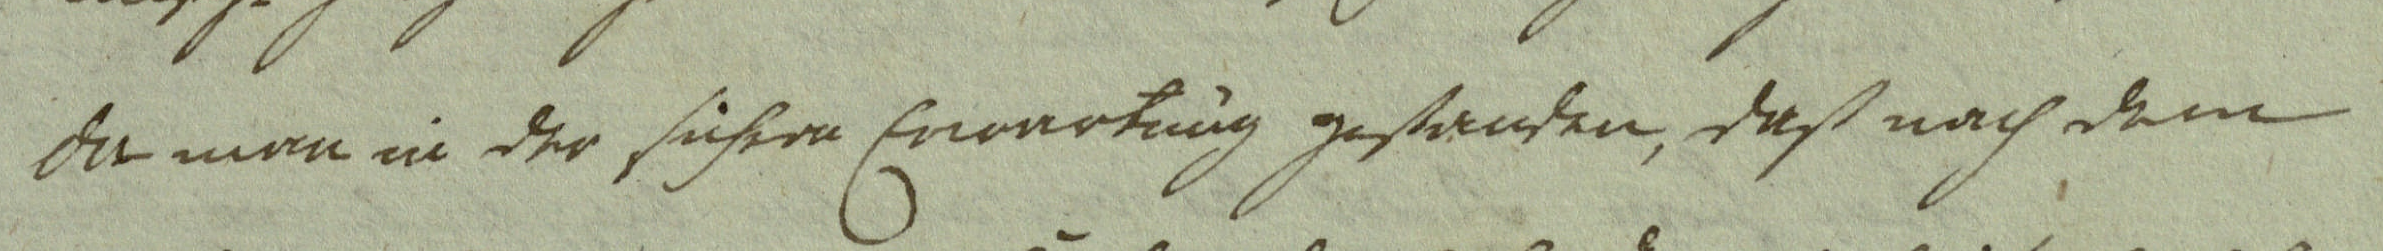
Da man in der sichern Erwartung gestanden, daß nach dem
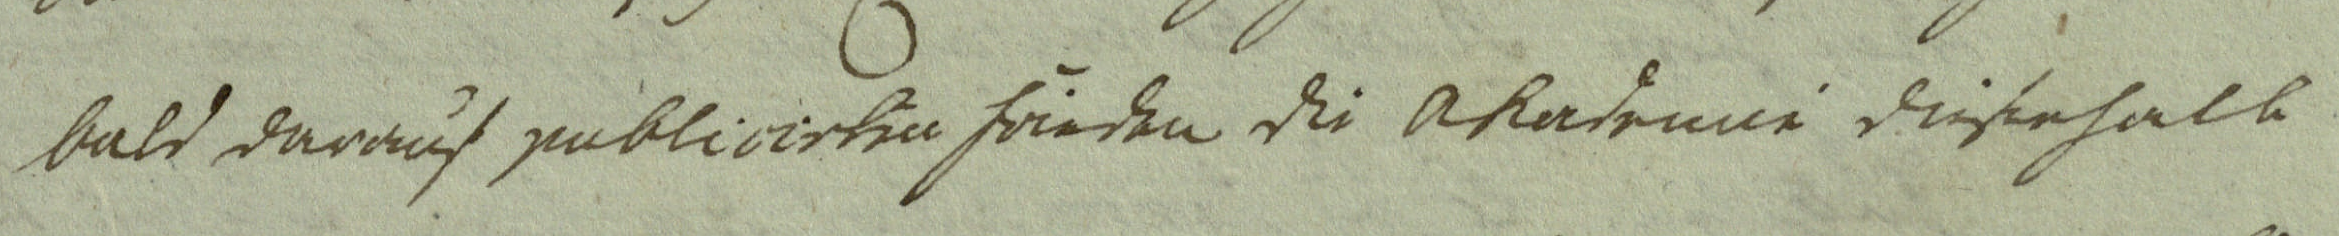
bald darauf publicirten Frieden die Akademie dieserhalb
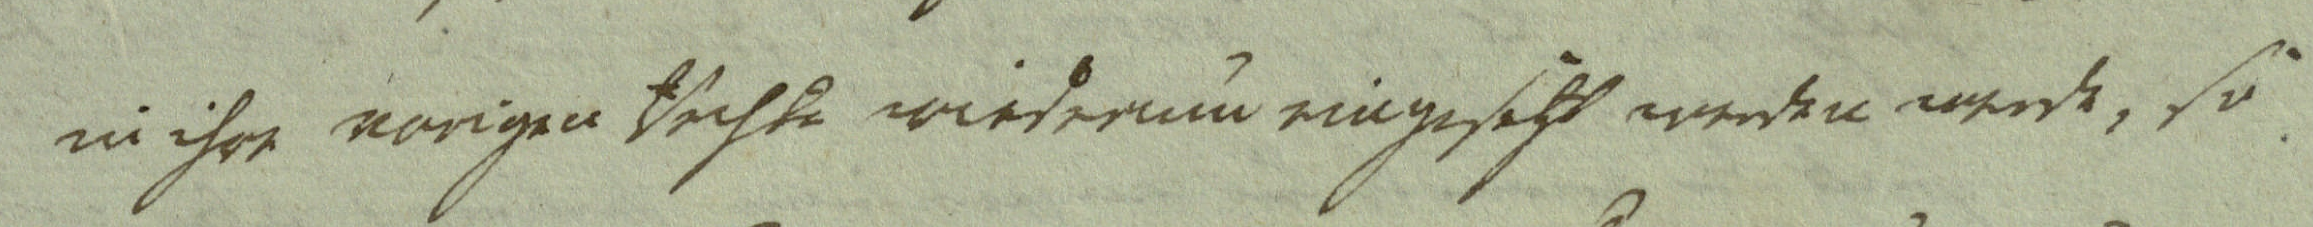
in ihre vorigen Rechte wiederum eingesetzt werden werde, so
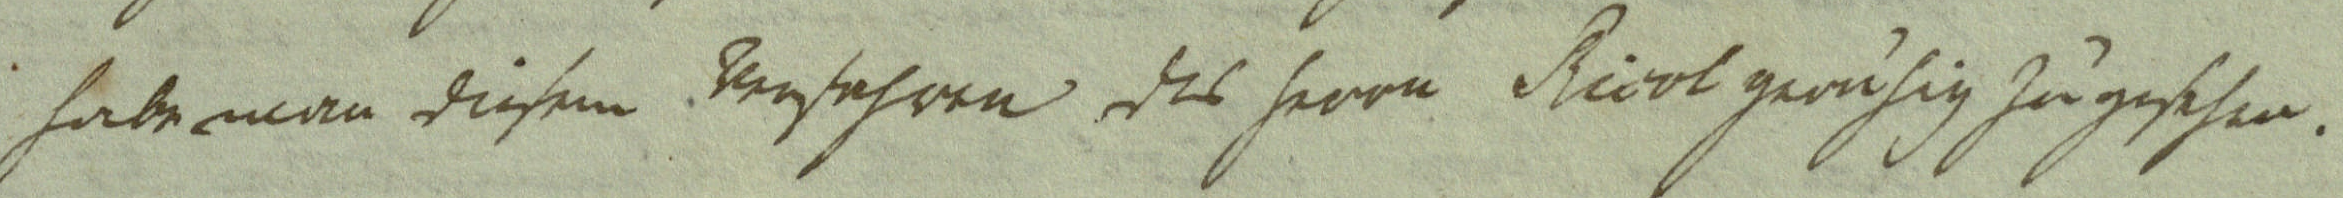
habe man diesem Verfahren des herrn Ricot geruhig zugesehen.
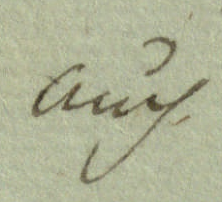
Auch
